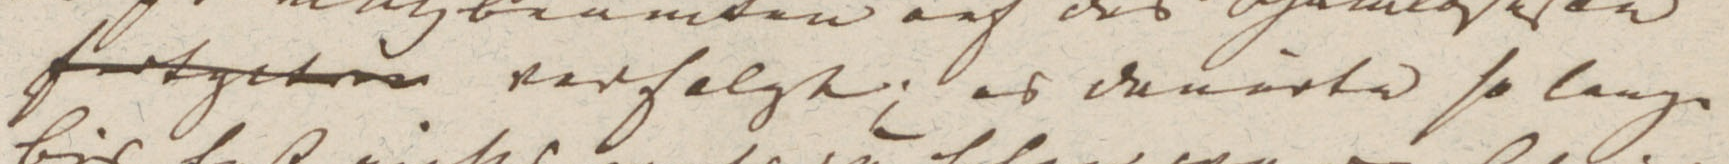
fortget verfolgt; es dauerte so lange
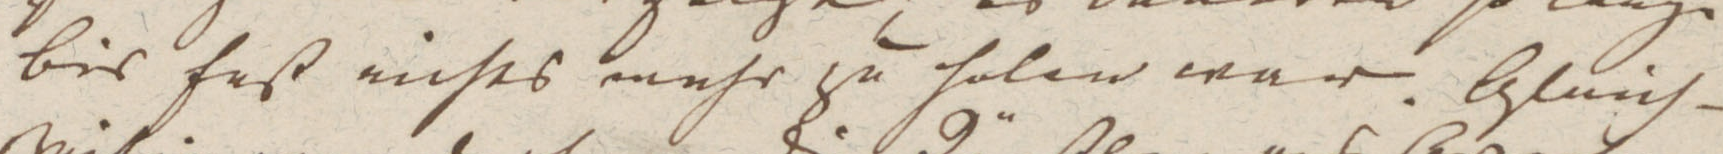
bis fast nichts mehr zu holen war. Gleich-
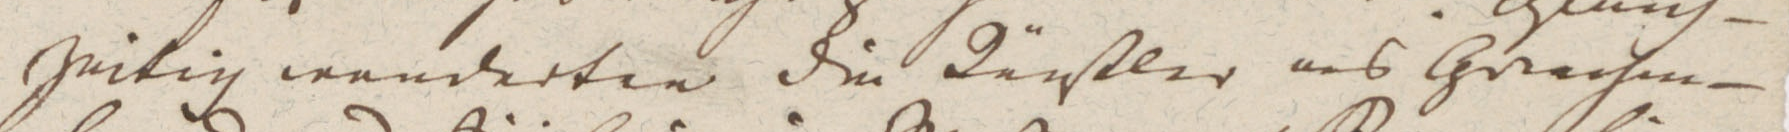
zeitig wanderten die Künstler aus Griechen-
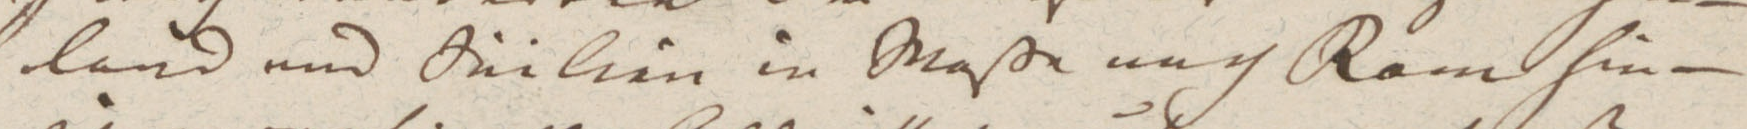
land und Sicilien in Masse nach Rom hin-
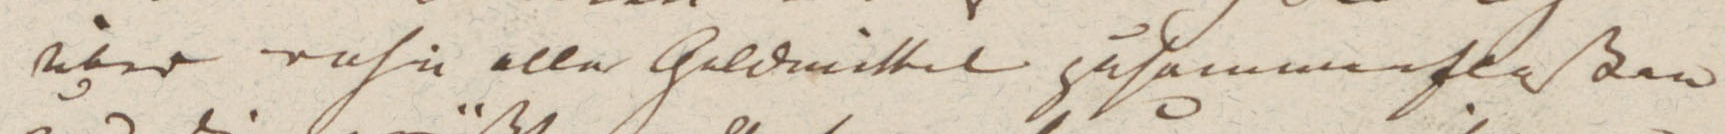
über wohin alle Geldmittel zusammenflossen
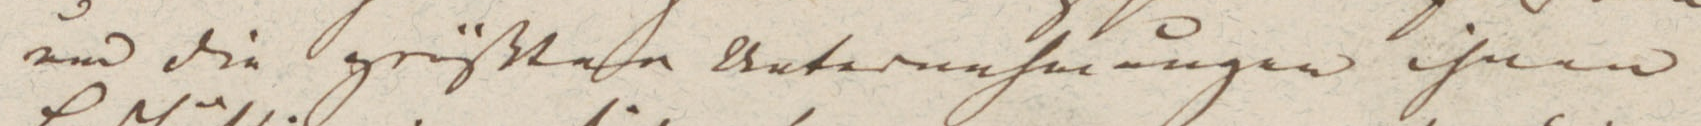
und die grössten Unternehmungen ihnen
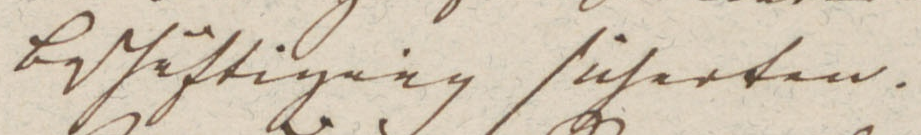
Beschäftigung sicherten.
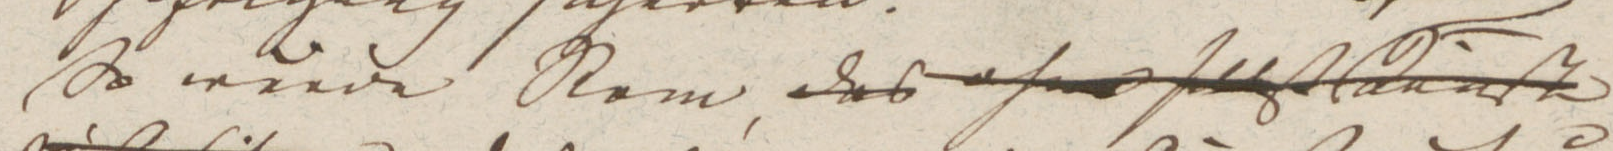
So wurde Rom, das ohne selbst ohne Kunst
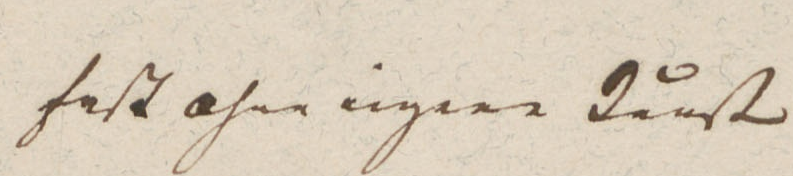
fast ohne eigene Kunst
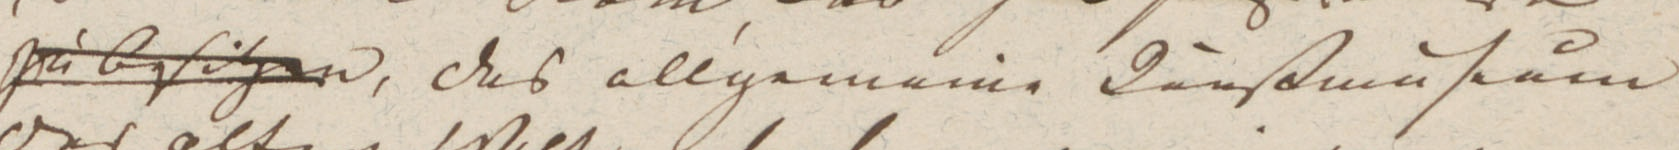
zu besitzen, das allgemeine Kunstmuseum
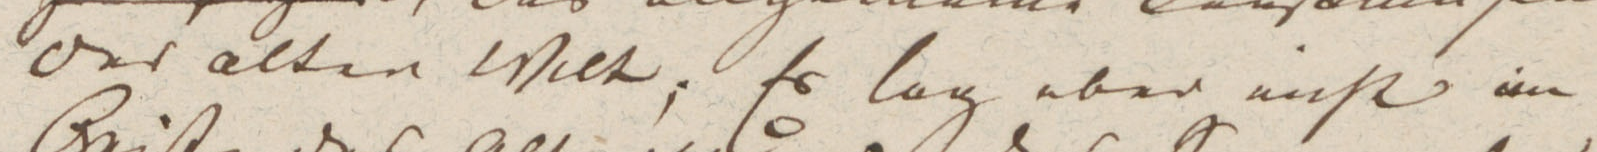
der alten Welt; Es lag aber nicht im
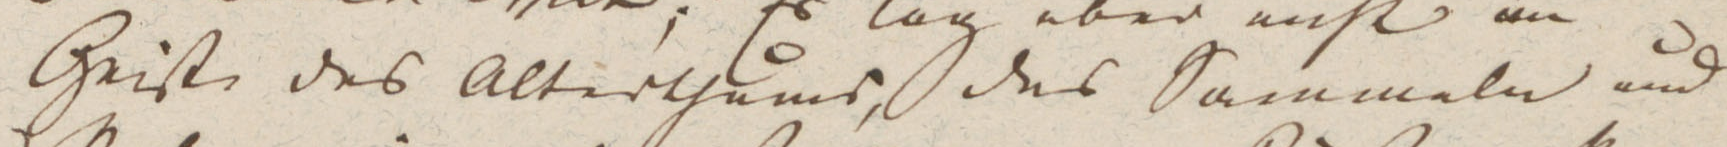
Geist des Alterthums, das Sammeln und
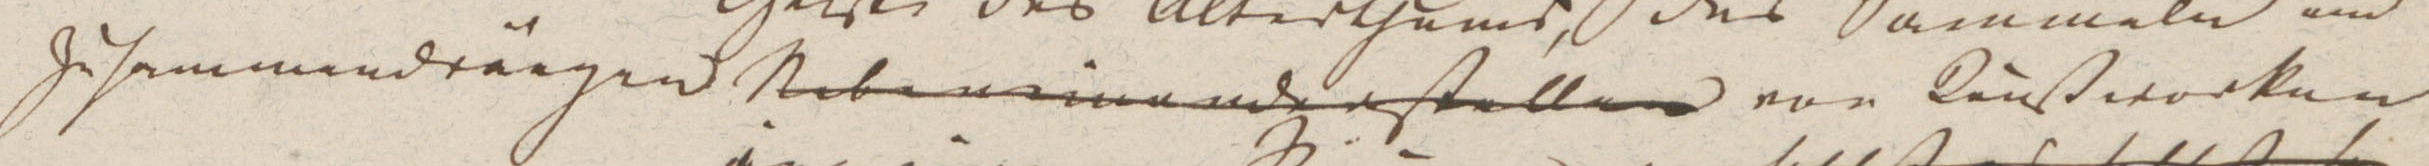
Zusammendrängen Nebeneinanderstellen von Kunstwerken
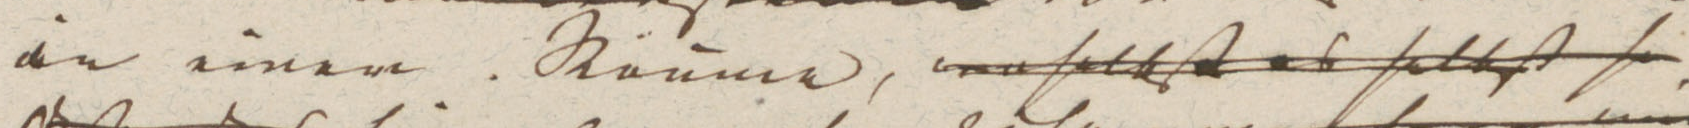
in einem Raume, woselbst es selbst s
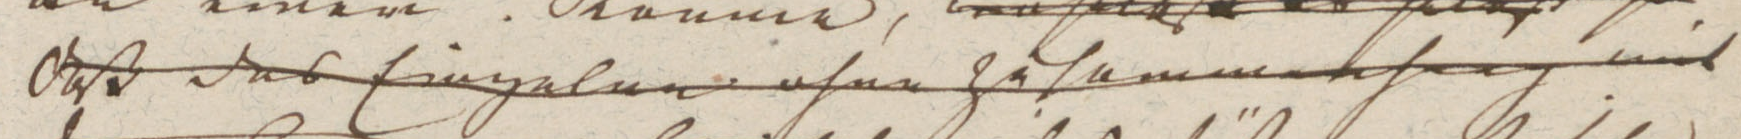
dass das Einzelne ohne Zusammenhang mit
